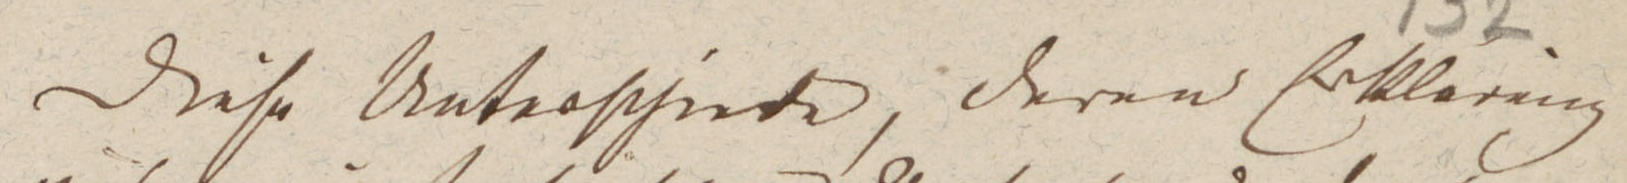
Diese Unterschiede, deren Erklärung
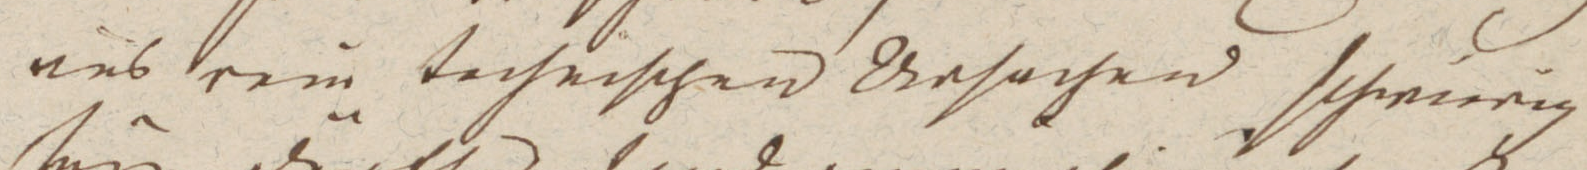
aus rein technischen Ursachen schwierig
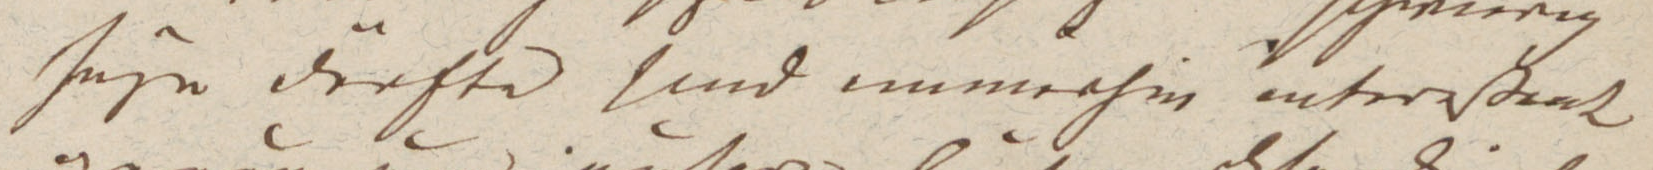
seyn dürfte sind immerhin interessant
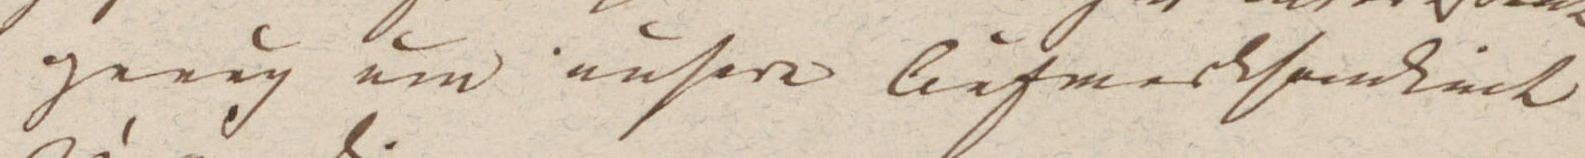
genug um unsere Aufmerksamkeit
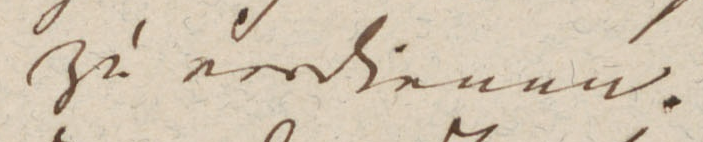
zu verdienen.
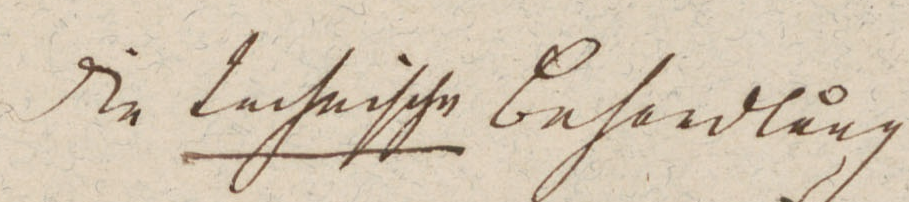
Die technische Behandlung
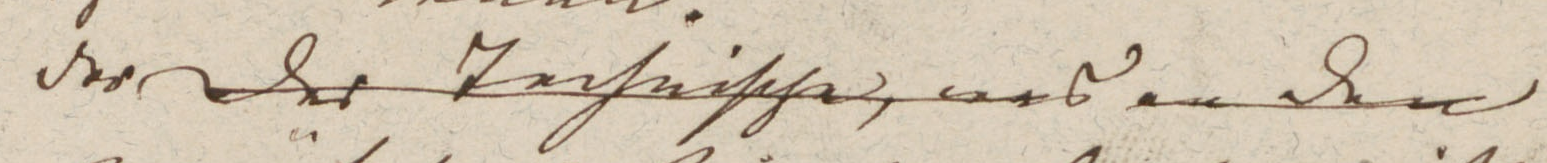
der Das Technische, was an den
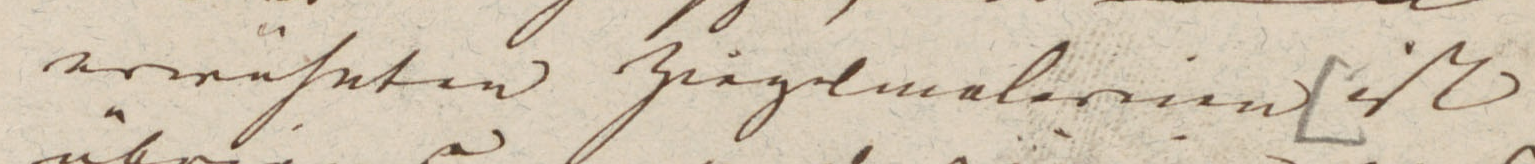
erwähnten Ziegelmalereien % ist
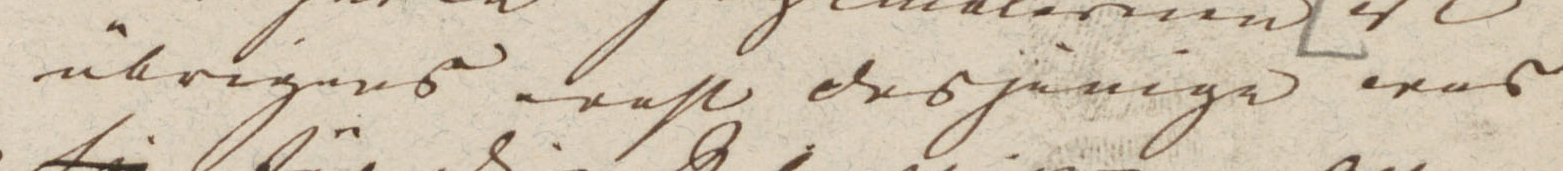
übrigens wohl dasjenige was
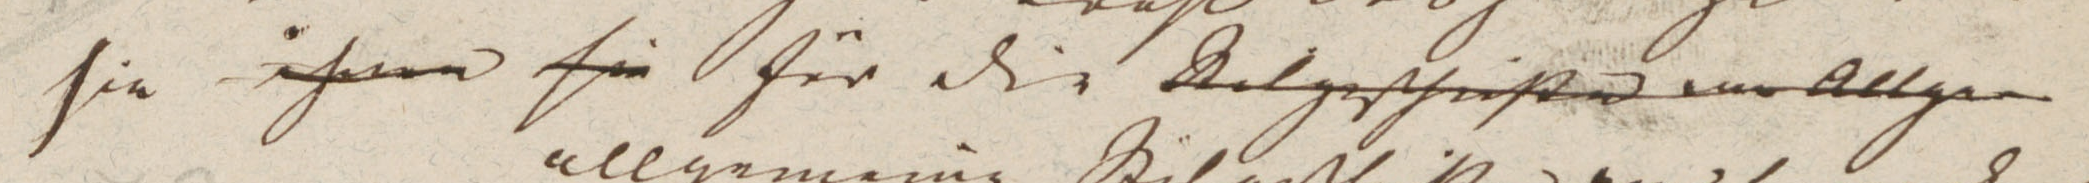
sie ihnen sie für die Stilgeschichte im Allge-
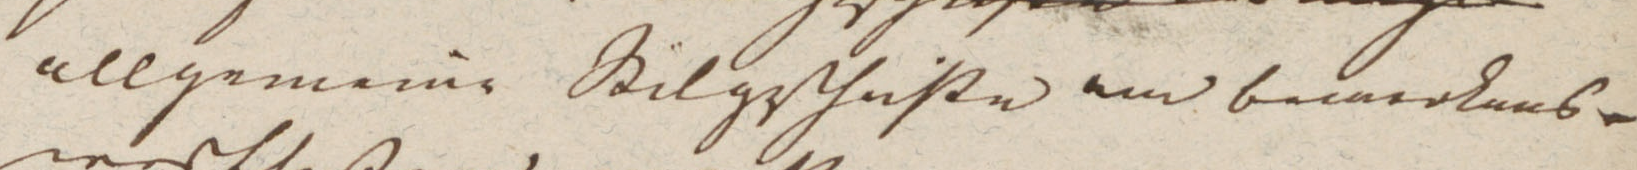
allgemeine Stilgeschichte am bemerkens-
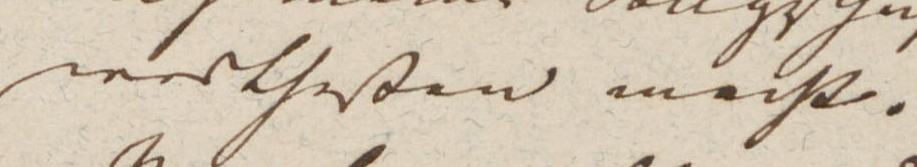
werthesten macht.
